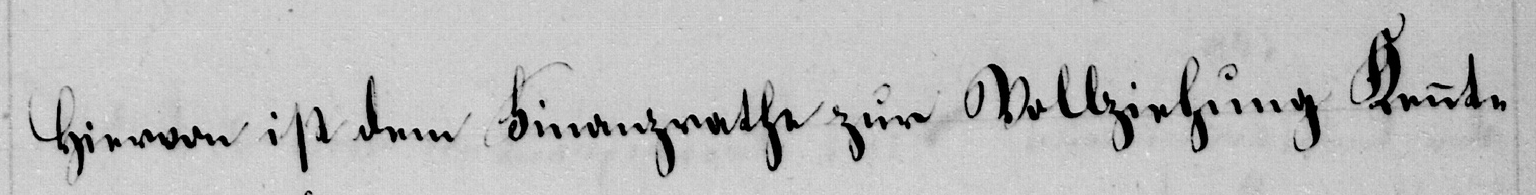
Hiervon ist dem Finanzrathe zur Vollziehung Kennt¬
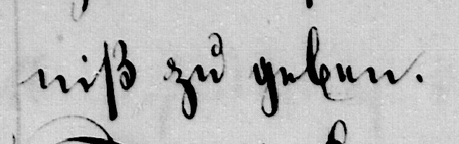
niß zu geben.
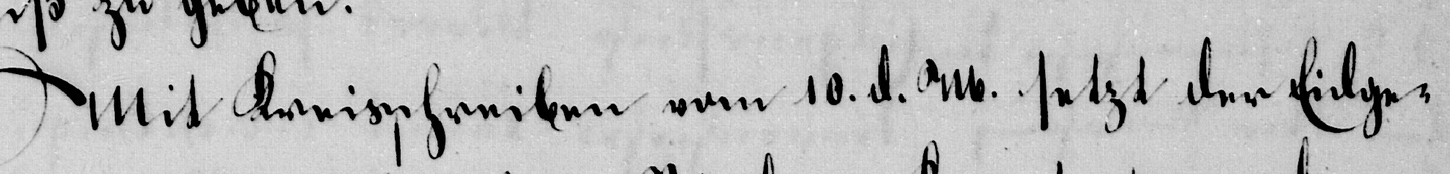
Mit Kreisschreiben vom 10. d. M. setzt der Eidge¬
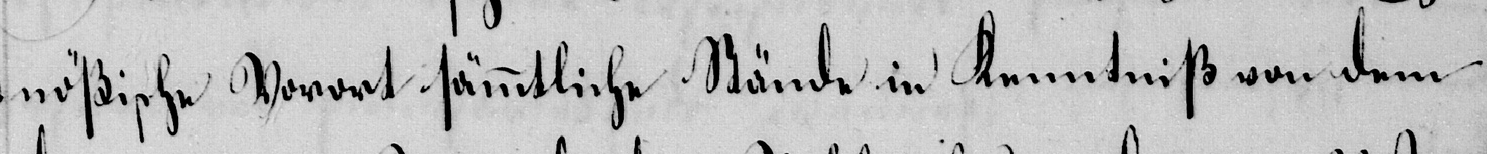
nößische Vorort sämmtliche Stände in Kenntniß von dem
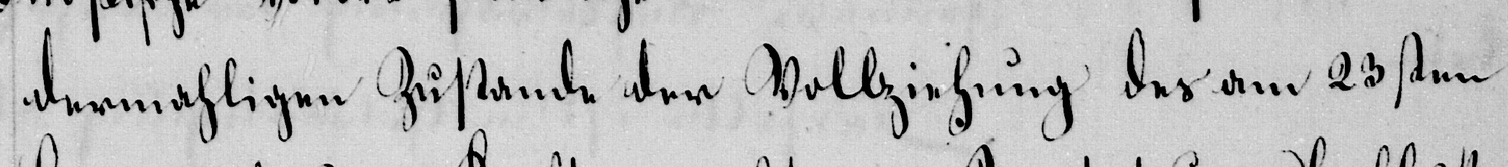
dermahligen Zustande der Vollziehung des am 23sten
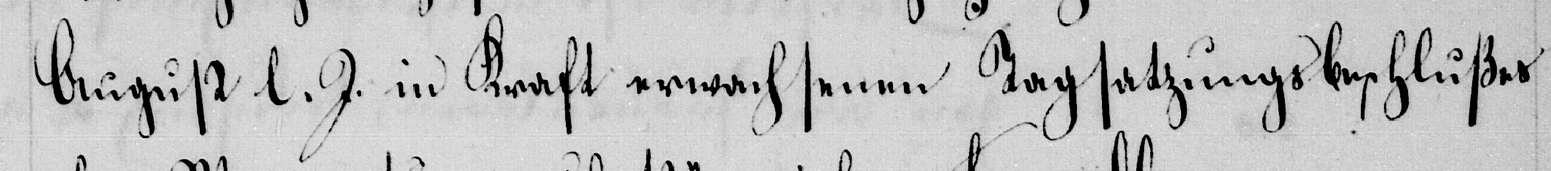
August l. J. in Kraft erwachsenen Tagsatzungsbeschlußes
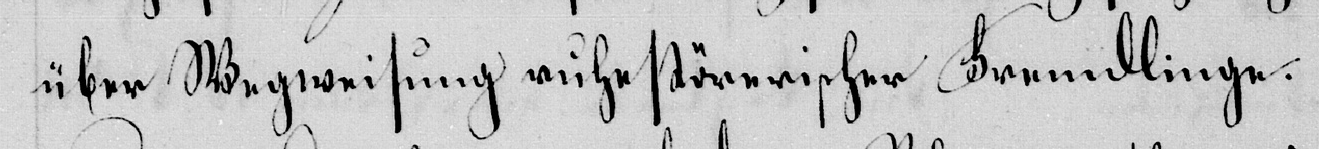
über Wegweisung ruhestörerischer Fremdlinge.
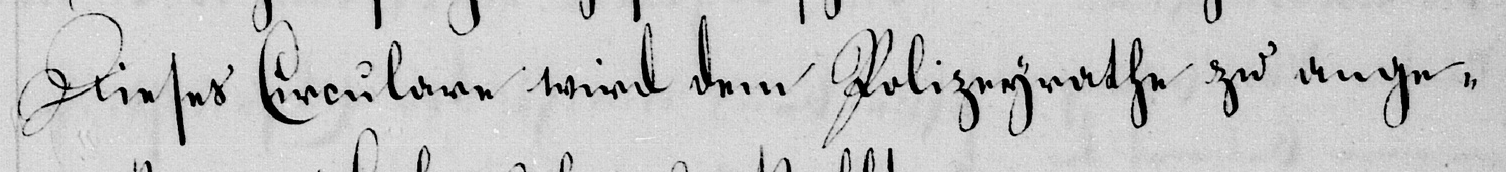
Dieses Circulare wird dem Polizeyrathe zu ange¬
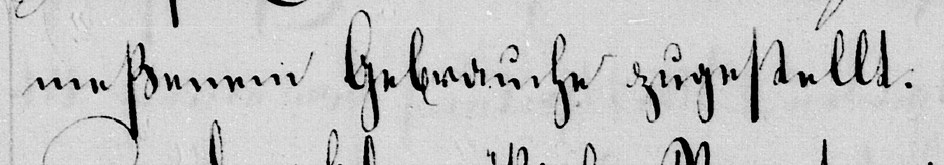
meßenen Gebrauche zugstellt.
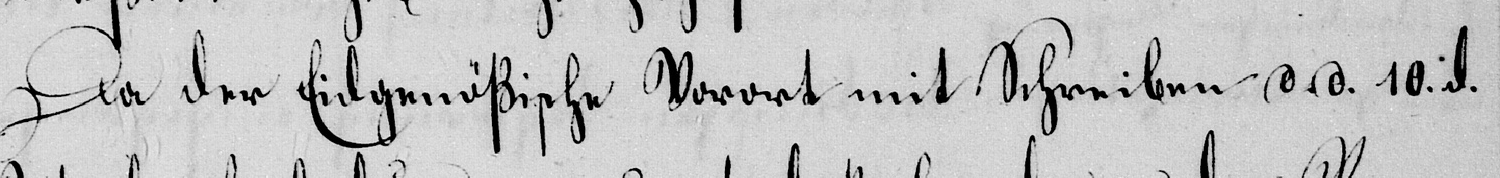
Da der Eidgenößische Vorort mit Schreiben d. d. 10. d.
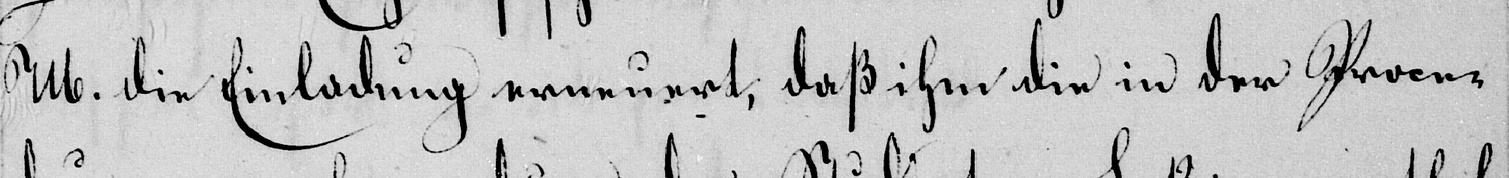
M. die Einladung erneuert, daß ihm die in der Proce¬
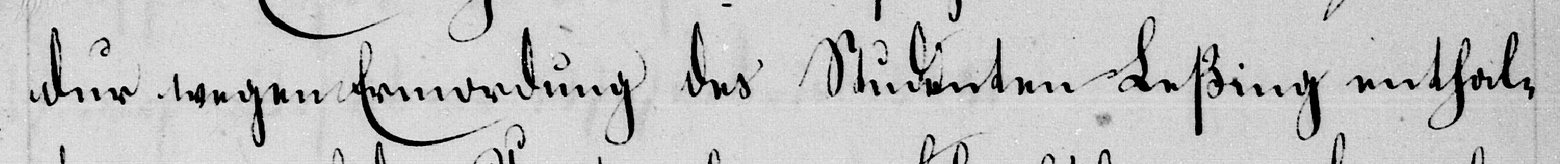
dur wegen Ermordung des Studenten Leßing enthal¬
